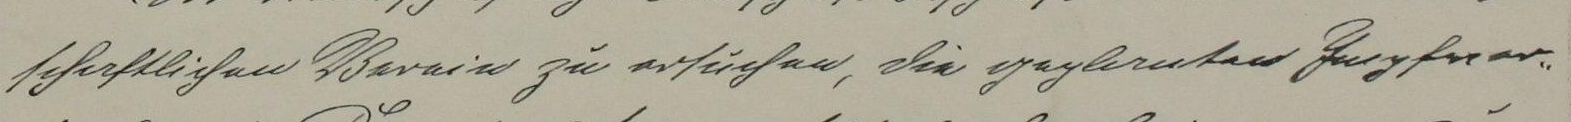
schaftlichen Verein zu ersuchen, die geplanten Impfver-
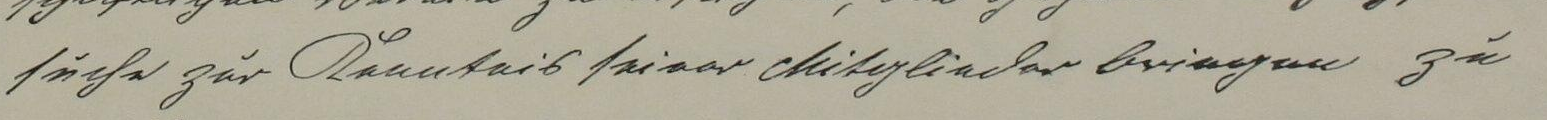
suche zur Kenntnis seiner Mitglieder bringen zu
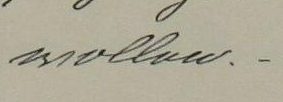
wollen.
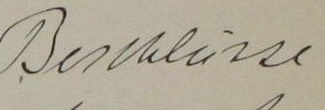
Beschlüsse
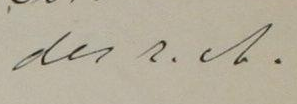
des r. A.
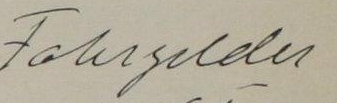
Fahrgelder
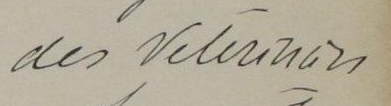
des Veterinärs
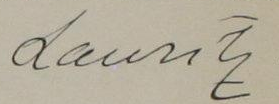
Lauritz
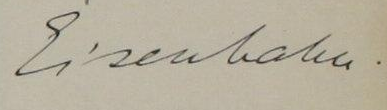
Eisenbahn-
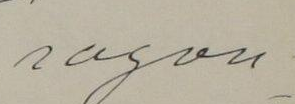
rayon-
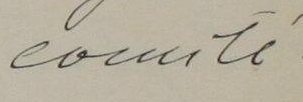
comité
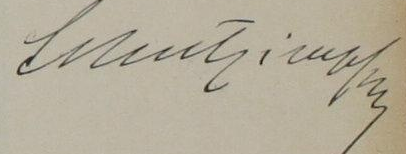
Schutzimpfungen
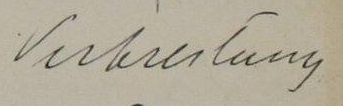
Verbreitung
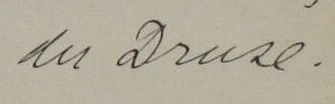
der Druse
